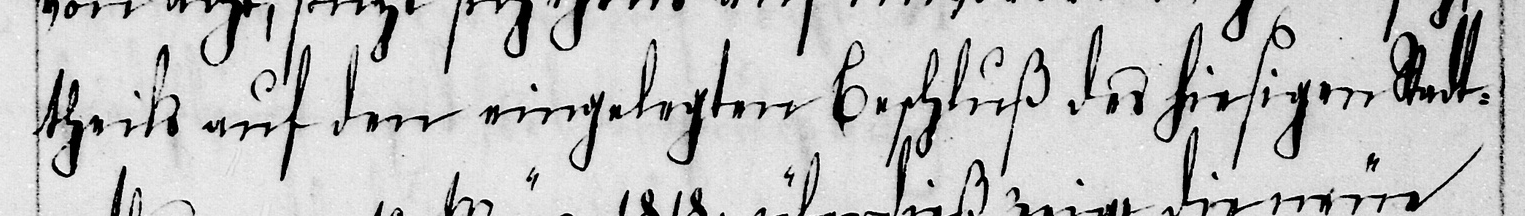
theils auf den eingelegten Beschluß des hiesigen Stadt¬
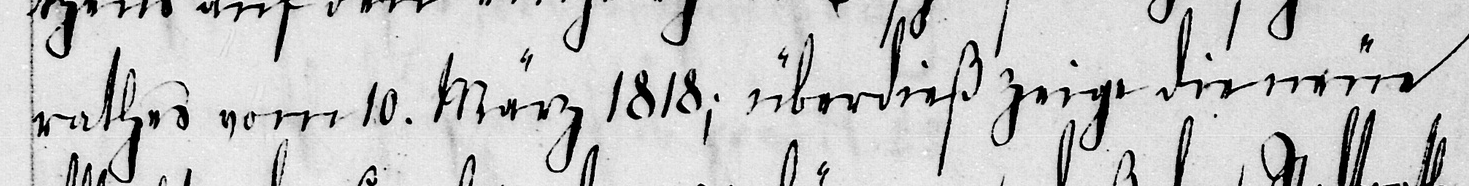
rathes vom 10. März 1818; überdieß zeige die neue
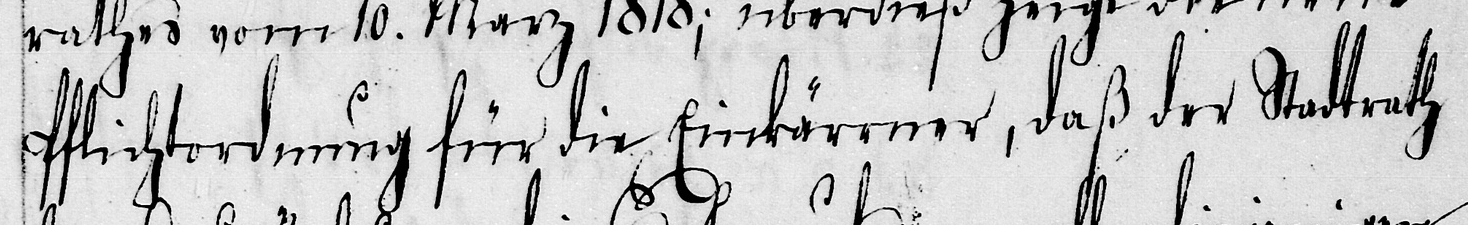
Pflichtordnung für die Einkärrner, daß der Stadtrath
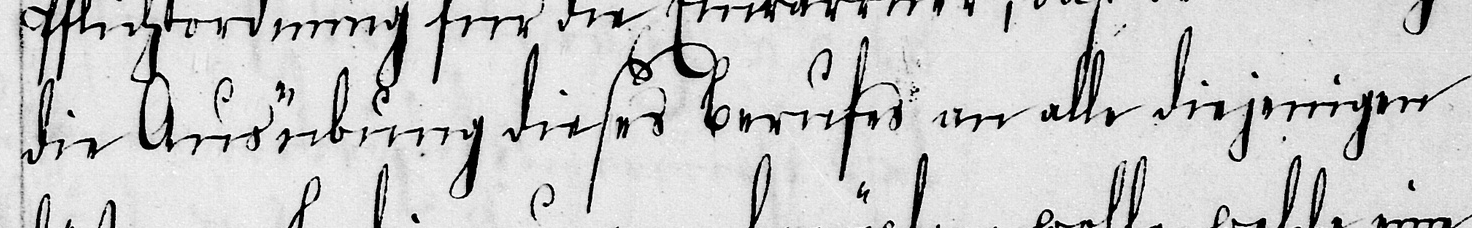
die Ausübung dieses Berufes an alle diejenigen
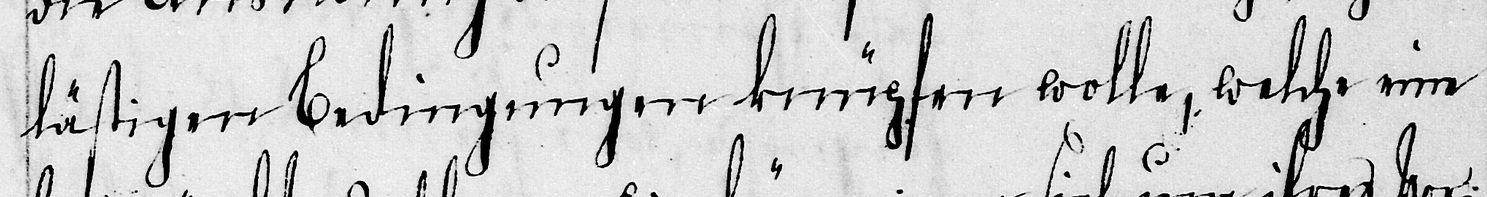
lästigen Bedingungen knüpfen wolle, welche eine
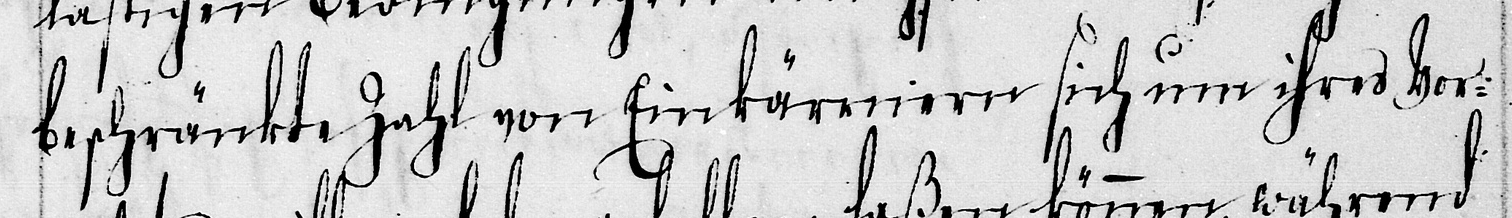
beschränkte Zahl von Einkärrnern sich um ihres Vor¬
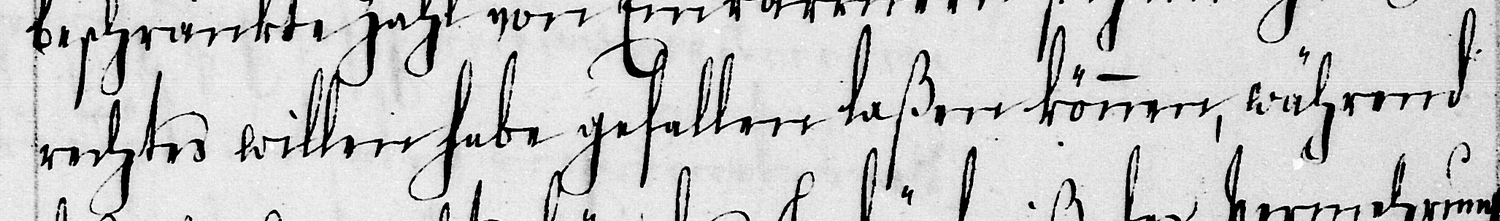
rechtes willen habe gefallen laßen können, während
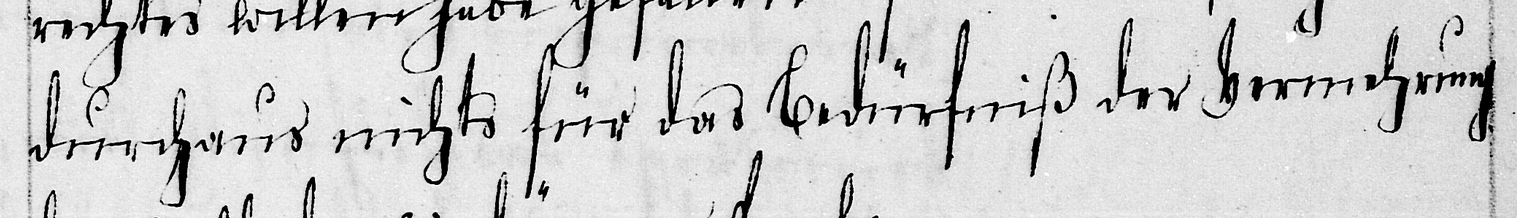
durchaus nichts für das Bedürfniß der Vermehrung
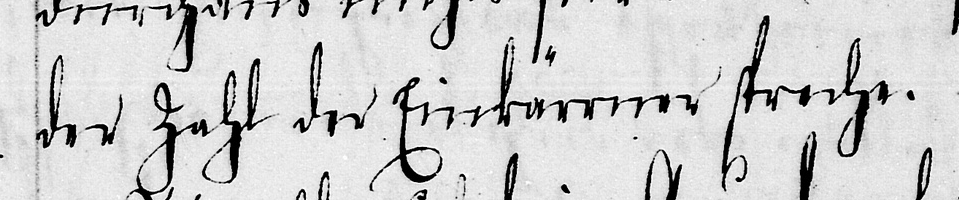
der Zahl der Einkärrner spreche.
